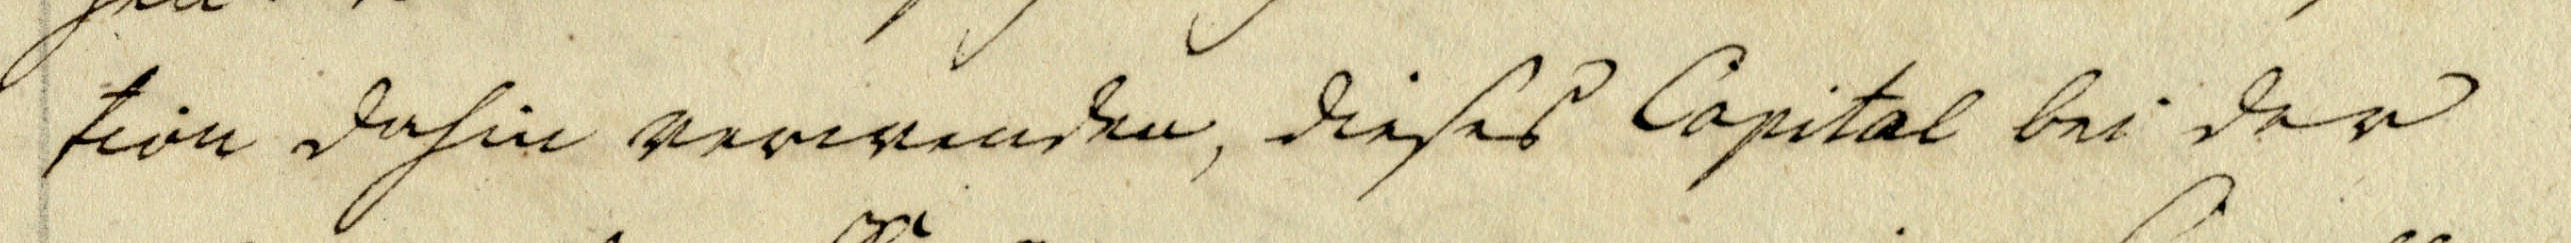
tion dahin verwenden, dieses Capital bei der
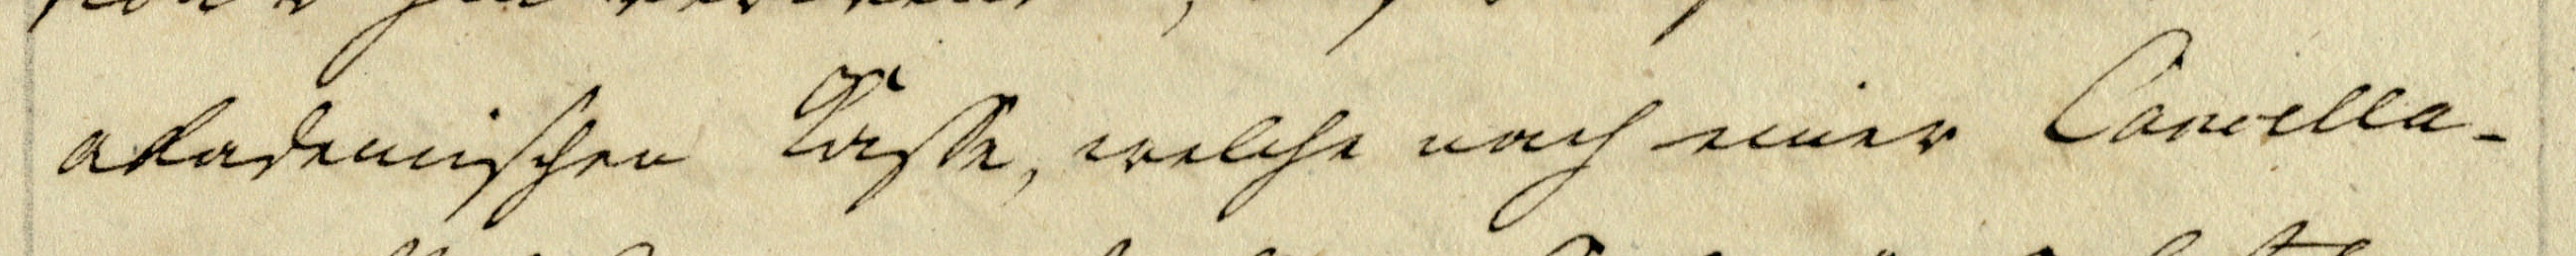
akademischen Casse, welche nach einer Cancella¬
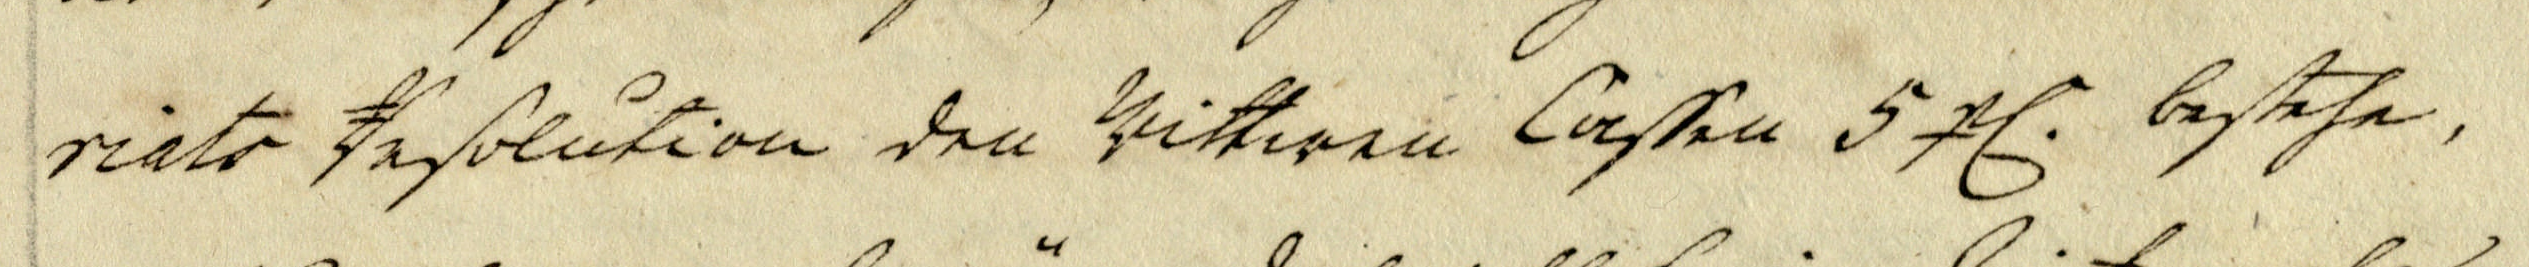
riats Resolution den Wittwen Cassen 5 pl. bestehe,
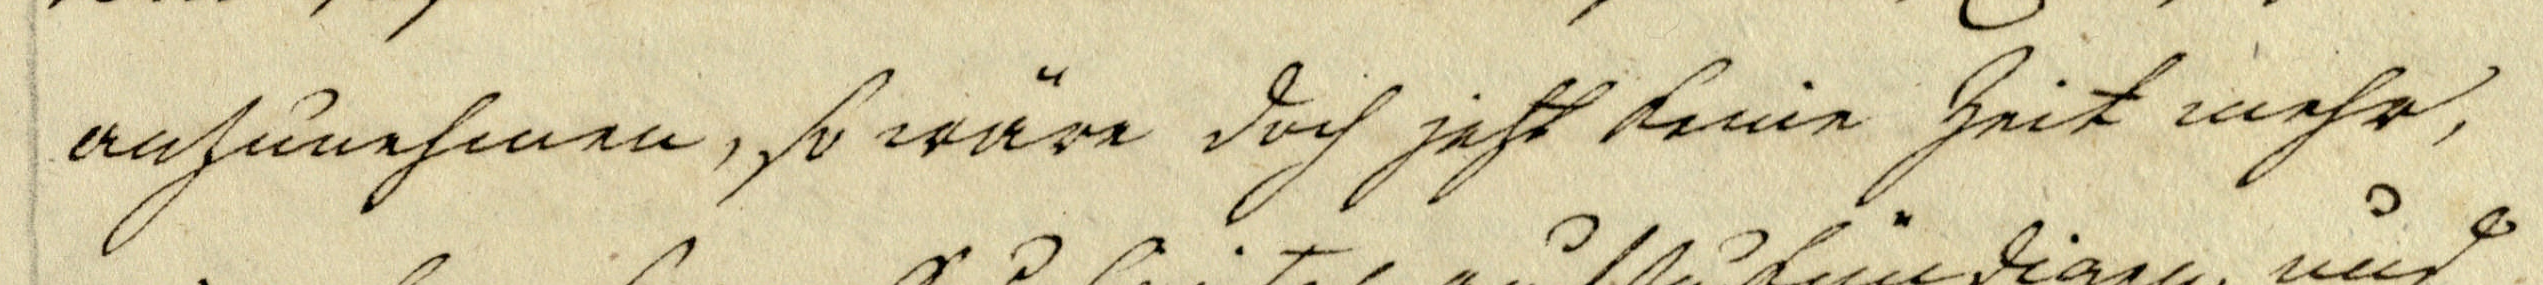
anzunehmen, so wäre doch jetzt keine Zeit mehr,
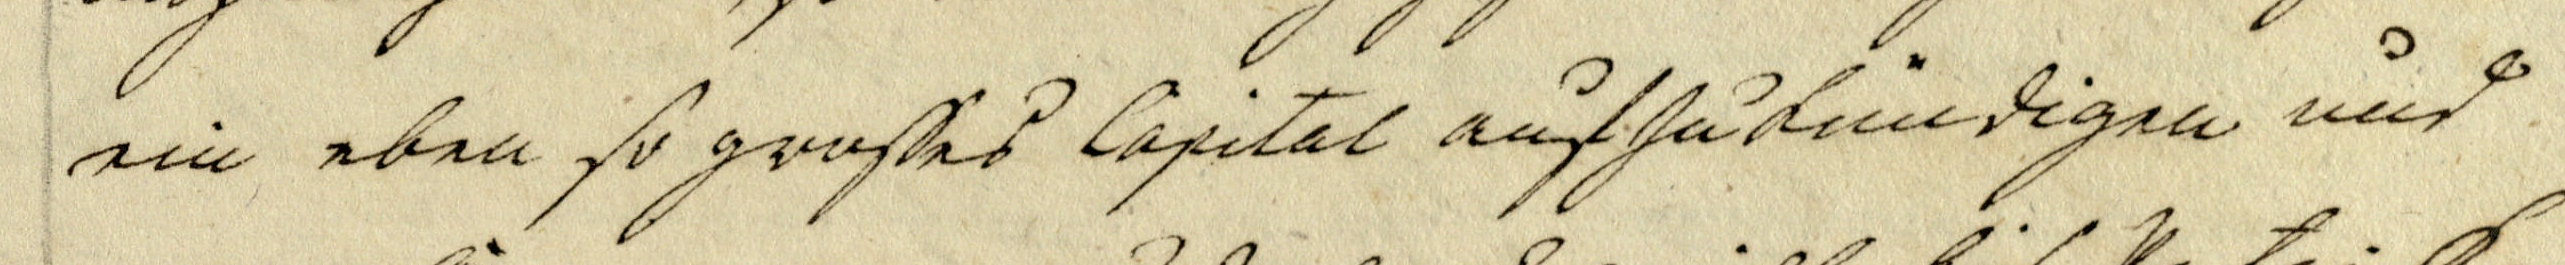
ein eben so grosses Capital aufzukündigen und
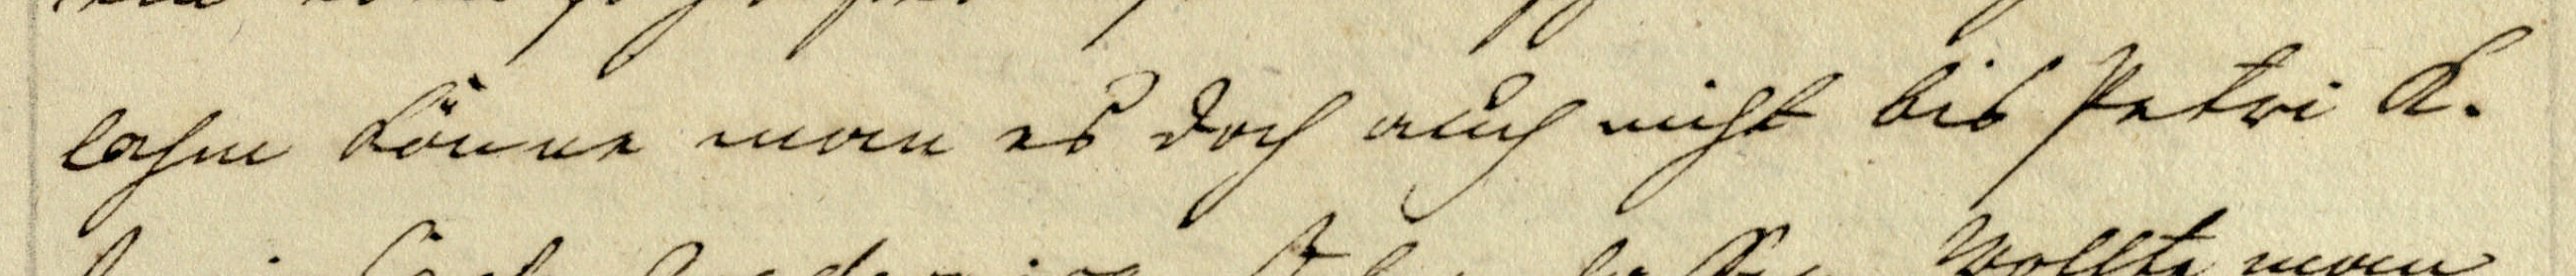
lahm könne man es doch auch nicht bis Petri k.
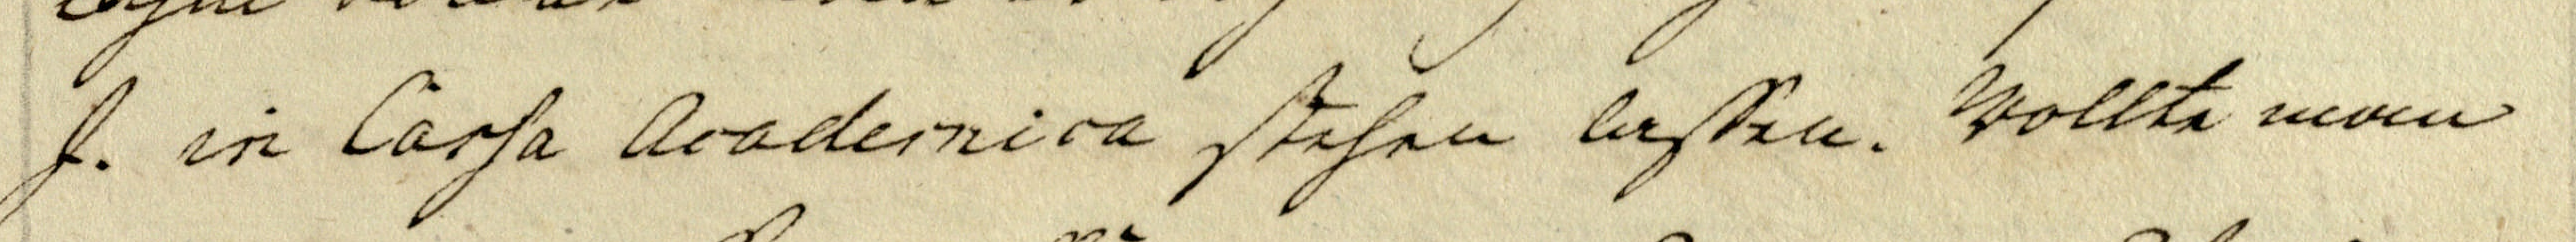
J. in Cassa Academica stehen lassen. Wollte man
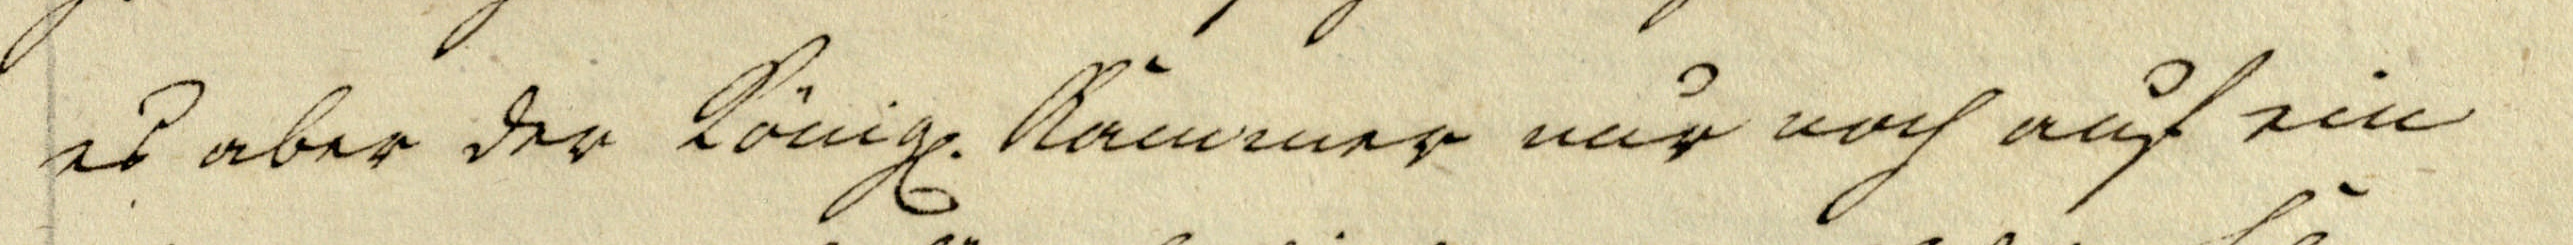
es aber der Königl. Kammer nur noch auf ein
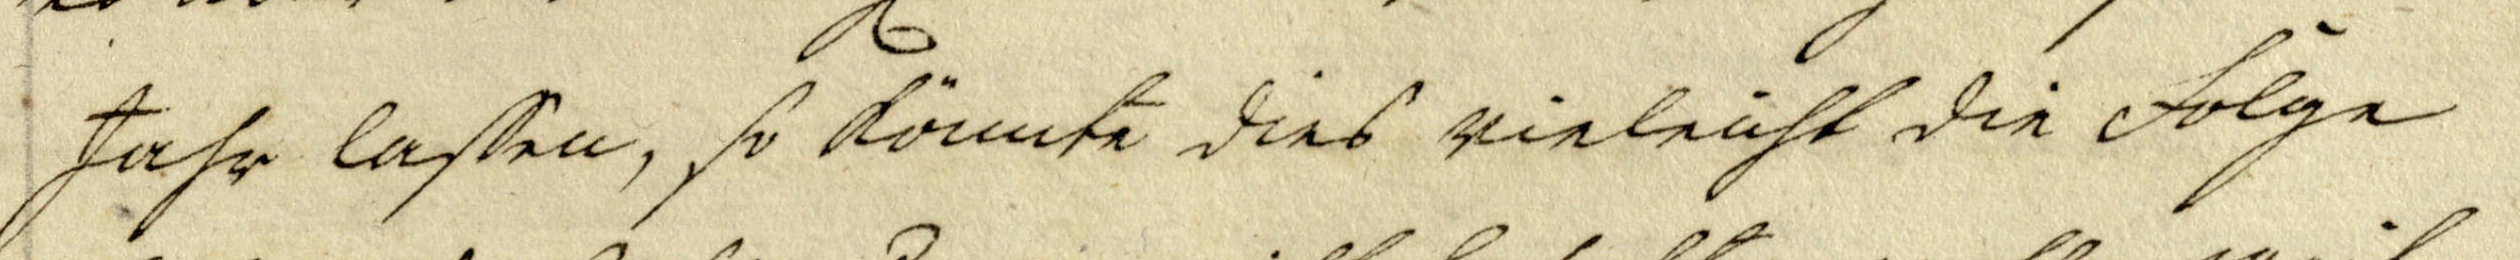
Jahr lassen, so könnte dies vieleicht die Folge
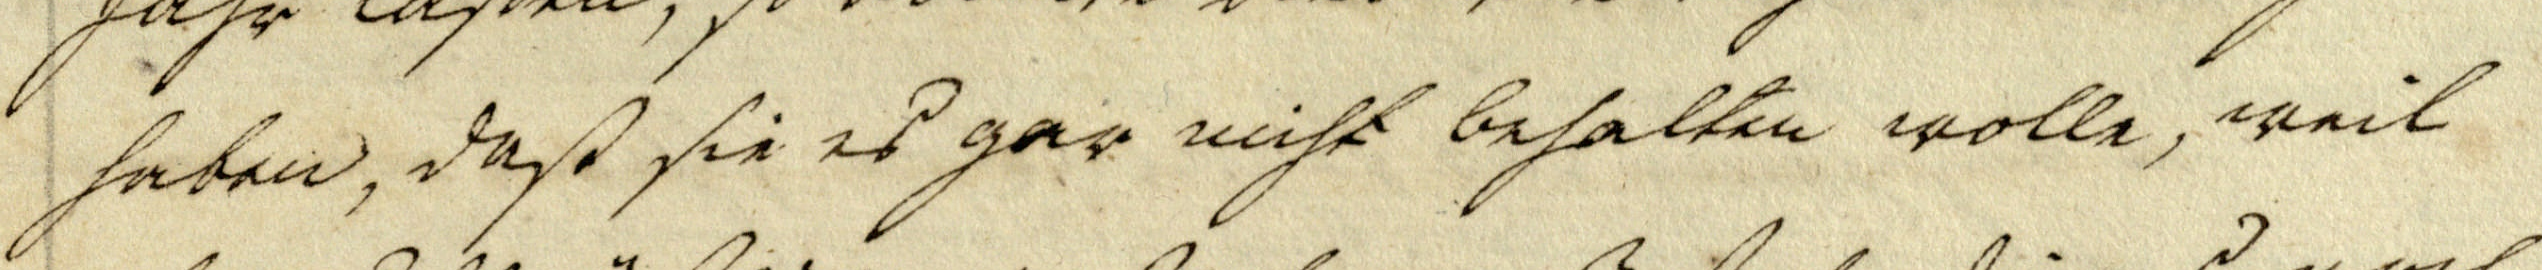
haben, daß sie es gar nicht behalten wolle, weil
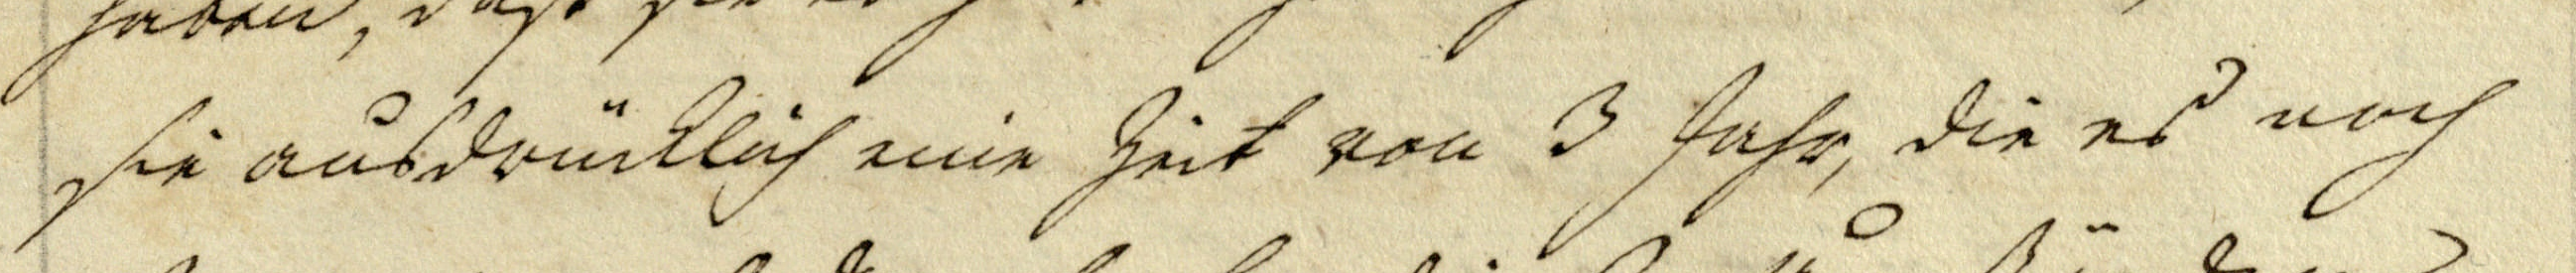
sie ausdrücklich eine Zeit von 3 Jahr, die es noch
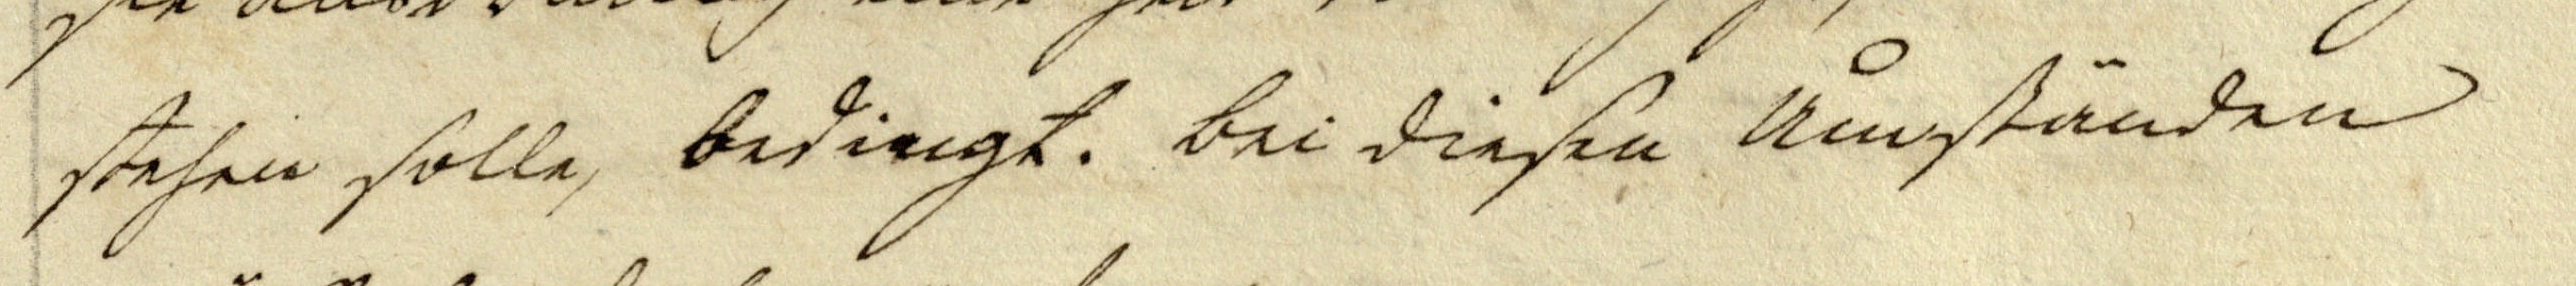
stehen solle, bedingt. Bei diesen Umständen
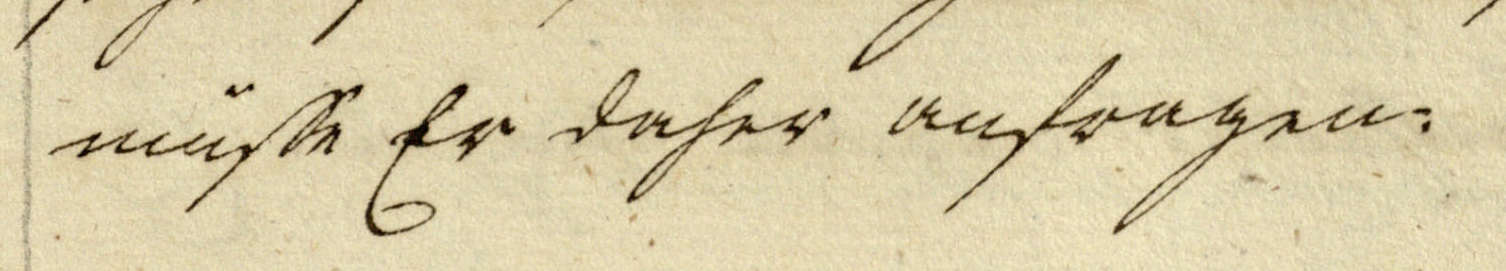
müsse Er daher anfragen:
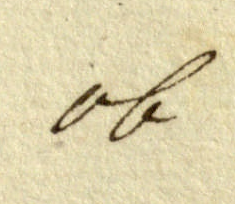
ob
